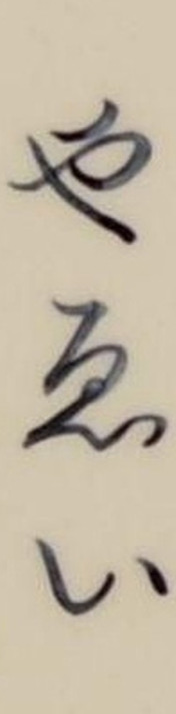やゑい
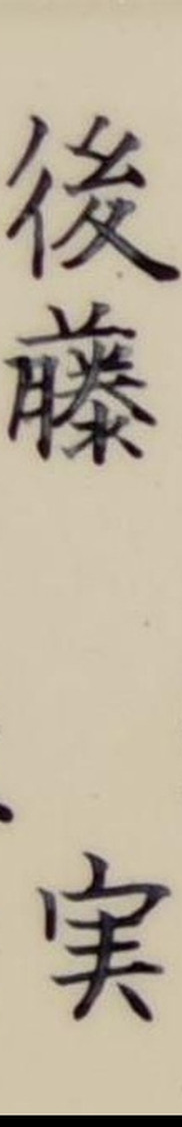後藤実
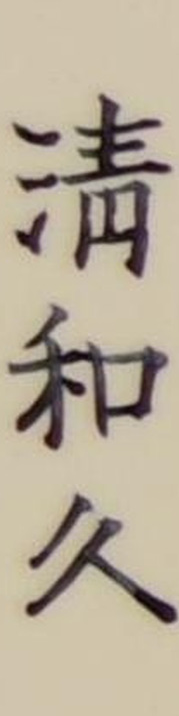清和久
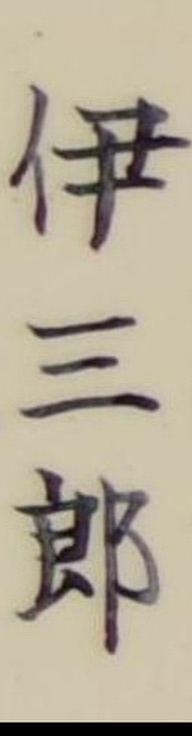伊三郎

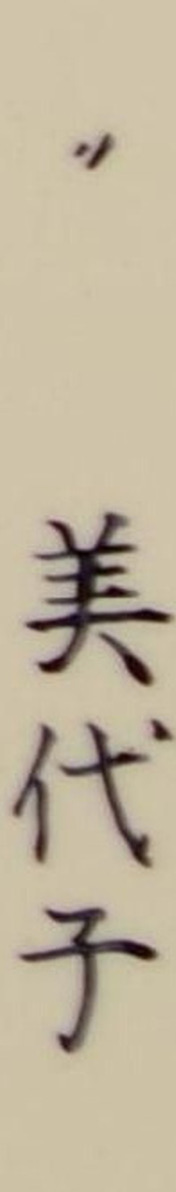美代子
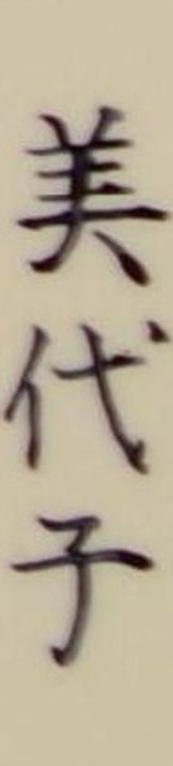美代子
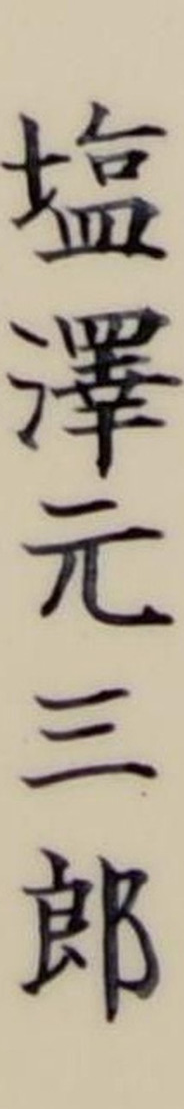塩澤元三郎
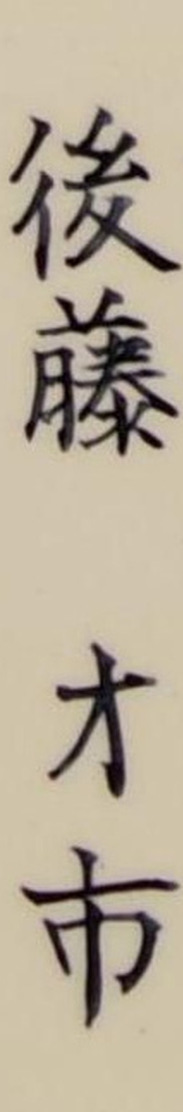後藤才市
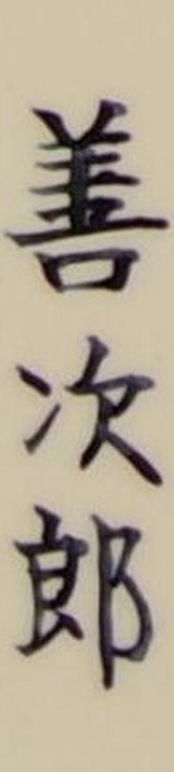善次郎
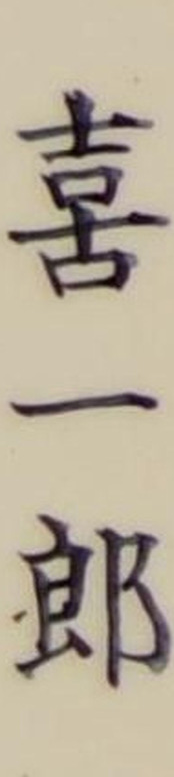喜一郎
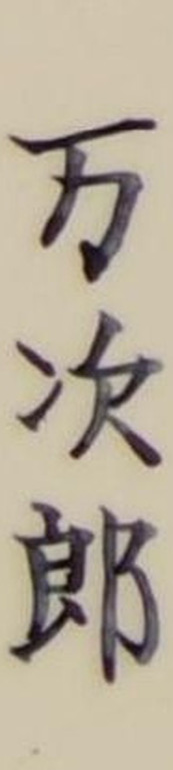万次郎

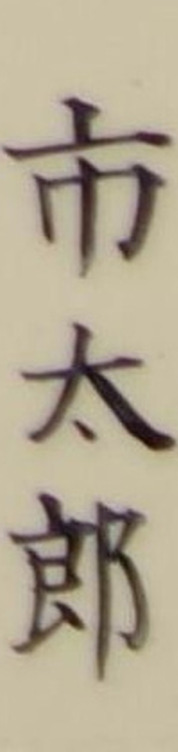市太郎
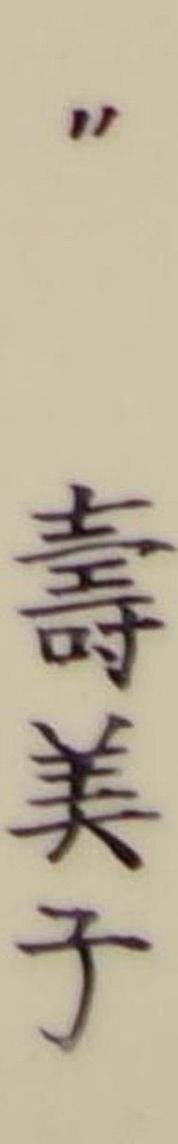壽美子
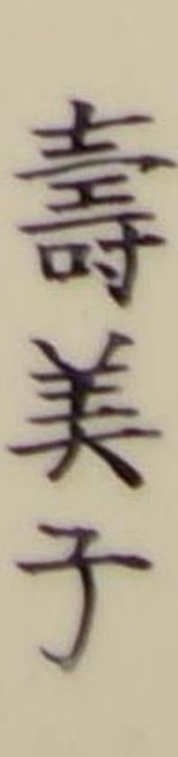壽美子
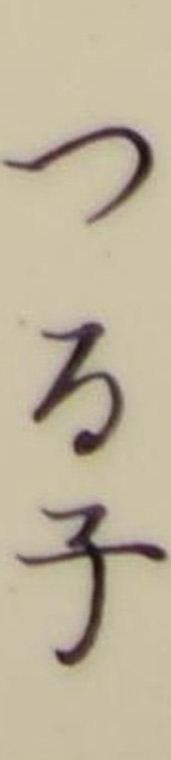つる子
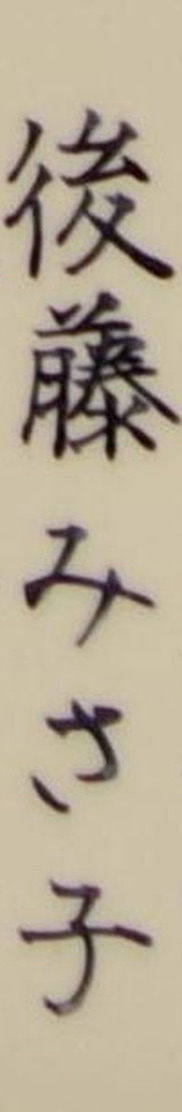後藤みさ子
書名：E~L
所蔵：高野山金剛峯寺
